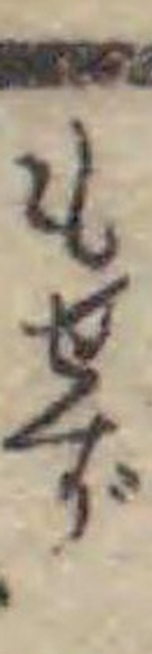もせず
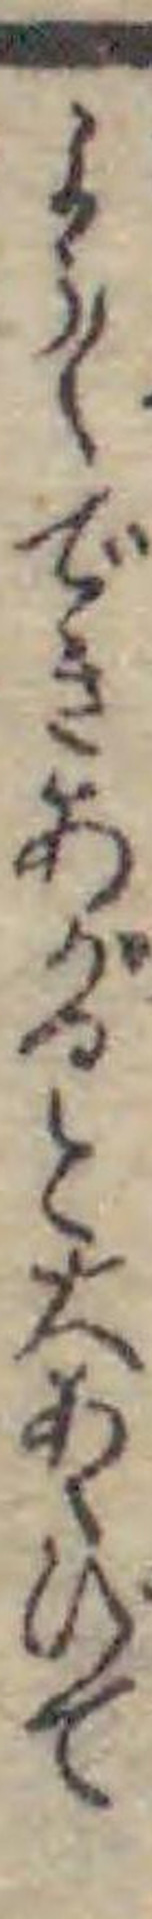よう〳〵できあがると大あくびて
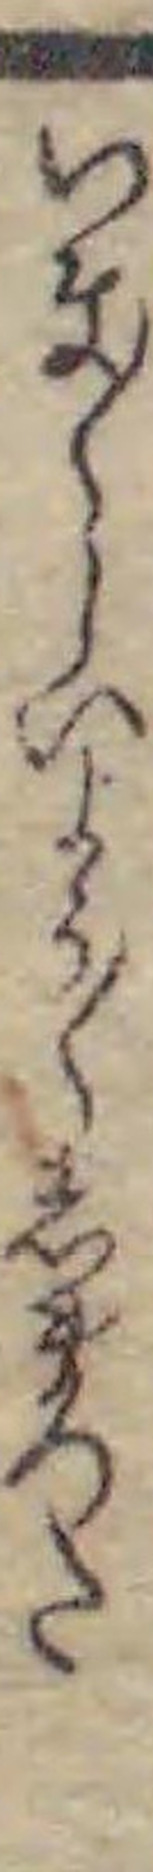いま〳〵しいよう〳〵しまつた
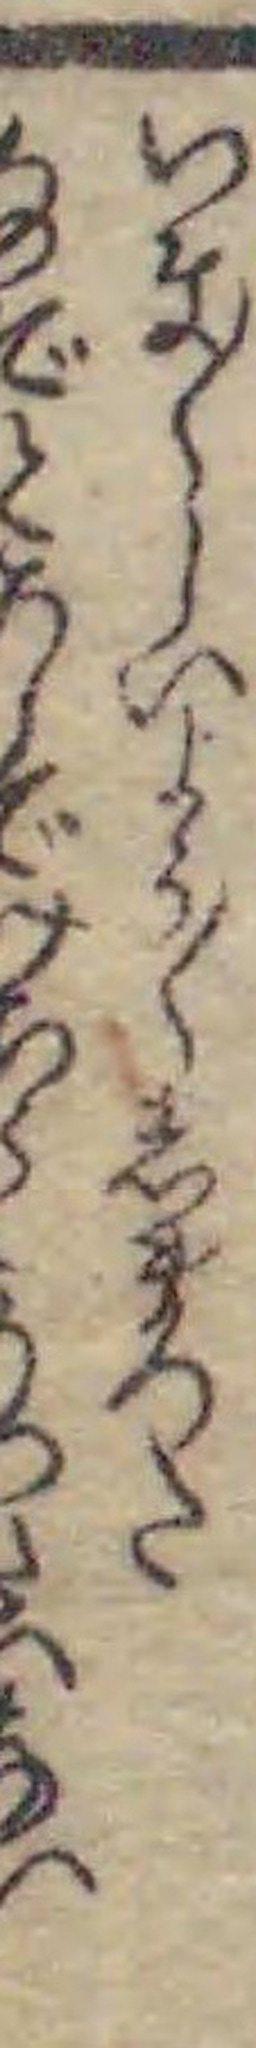なぞとあしでけちらかしもつたいない
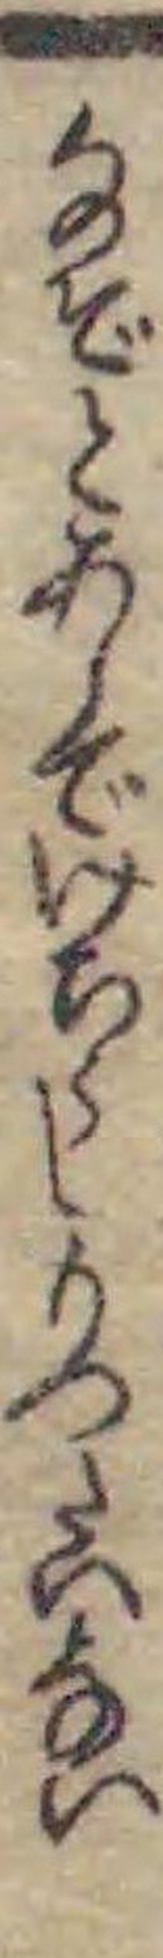なぞとあしでけちらかしもつたいない
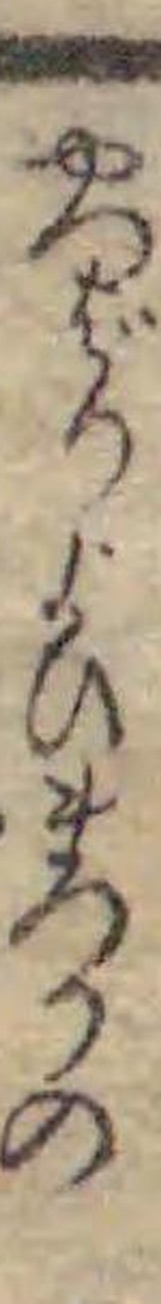やつばりよひまつりの
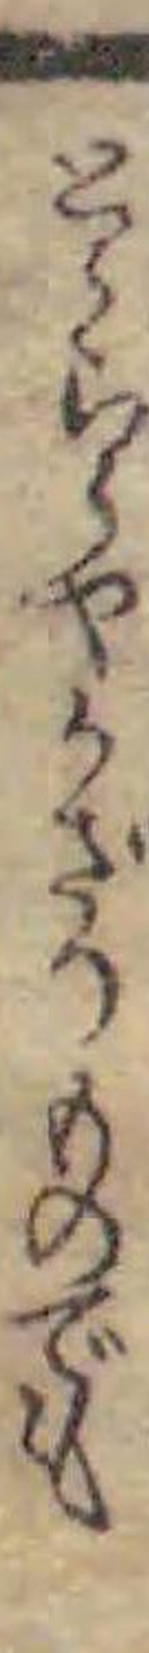とうらうやかざりものでも
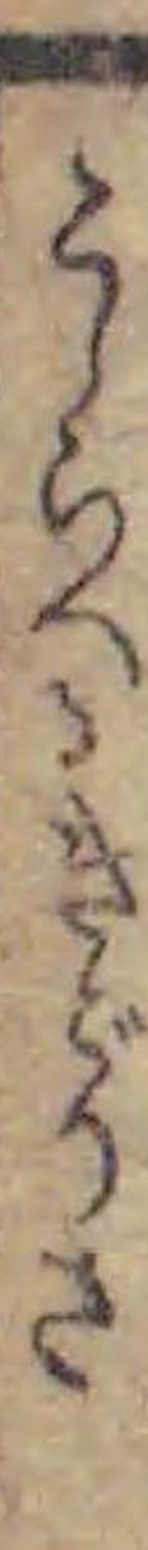こしらへるきどりさ

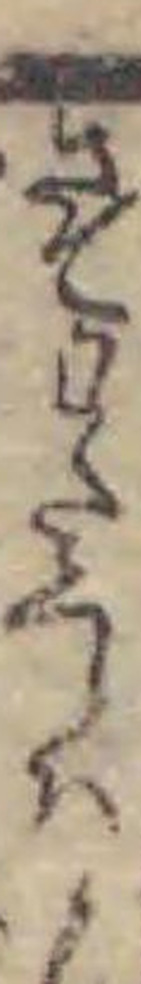さてわたくしは
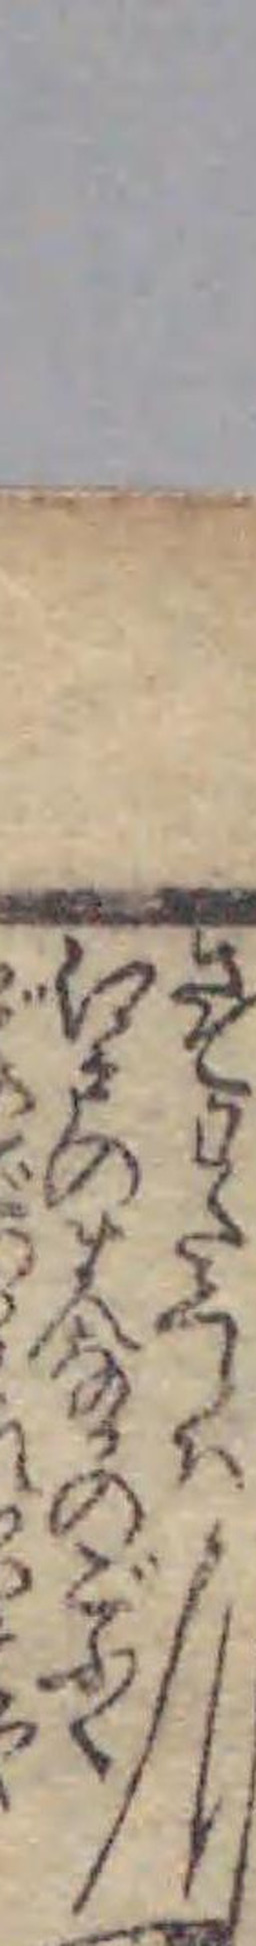江戸のまんなかのごふく
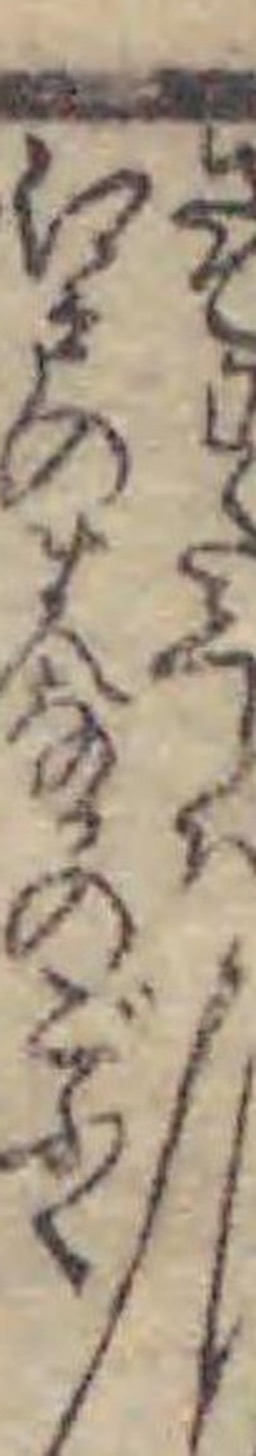江戸のまんなかのごふく
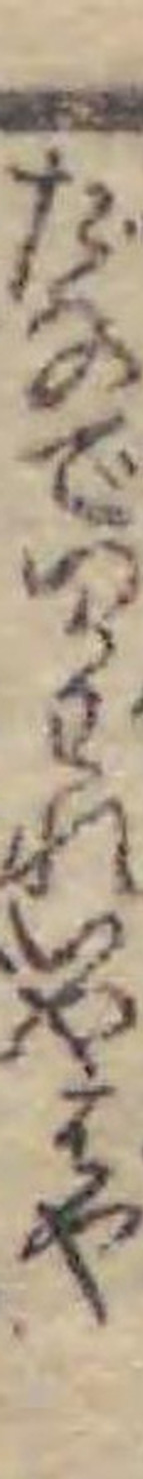だなでつかわれいやはや
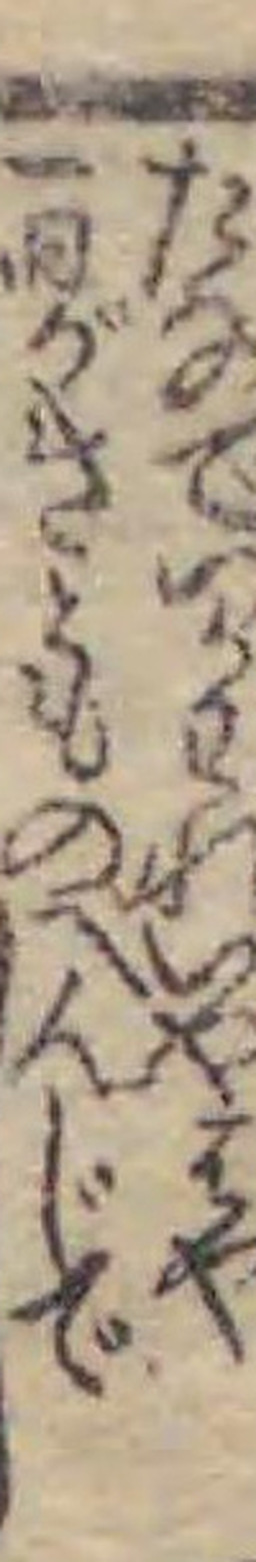一日がきとものへんじで
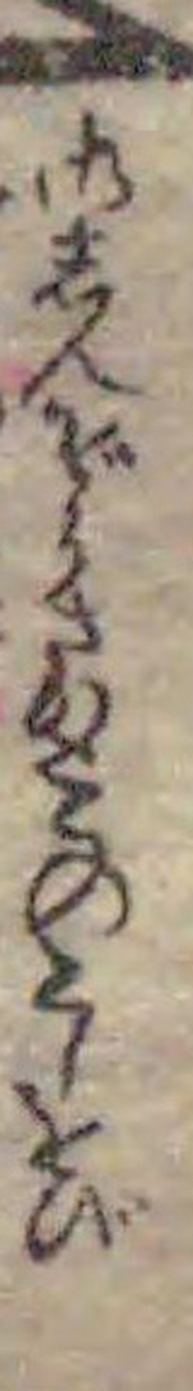御しんぞうさまそのこしをび
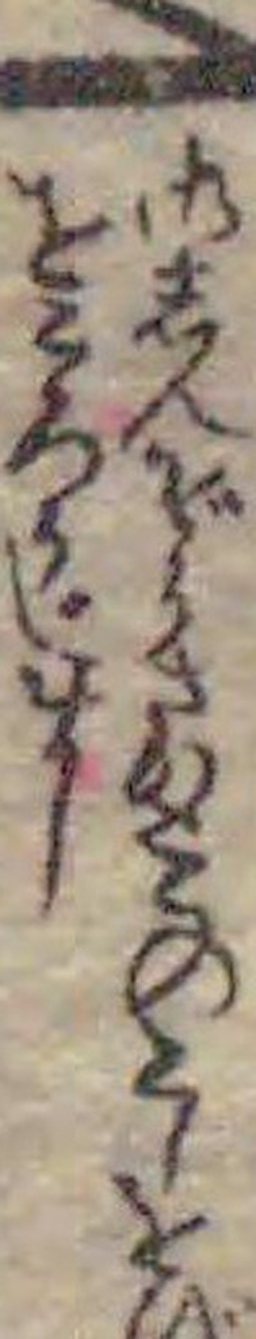をころうじまし
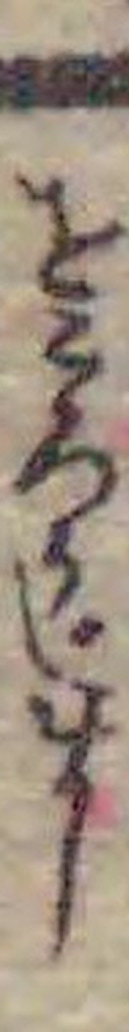をころうじまし
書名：紙屑身上噺 : 3巻
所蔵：国立国会図書館 National Diet Library, JAPAN
